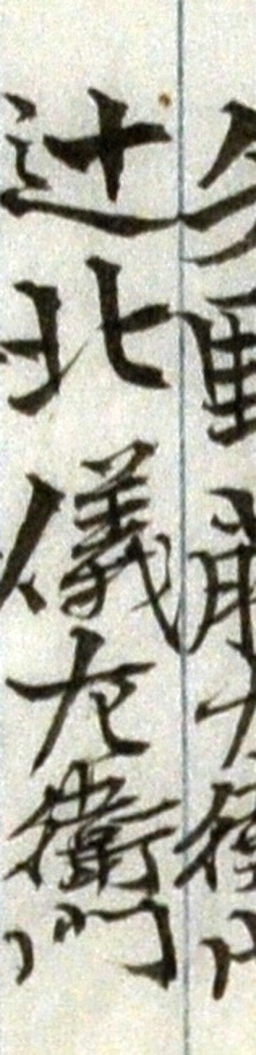一辻北儀左衛門
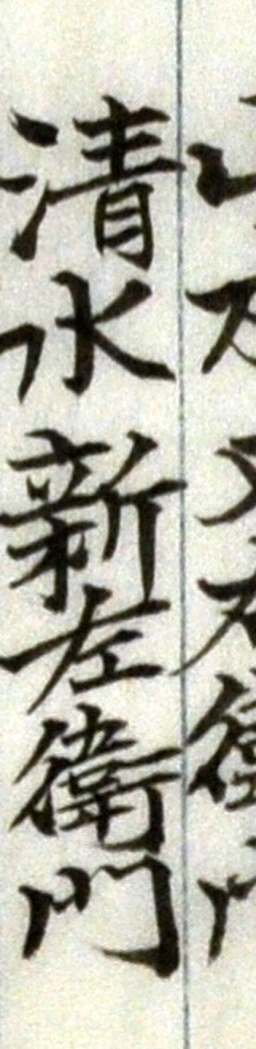一清水新左衛門

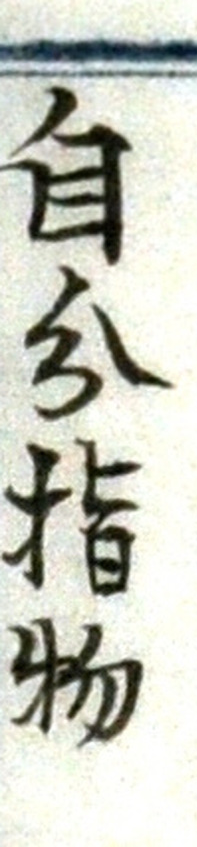自分指物
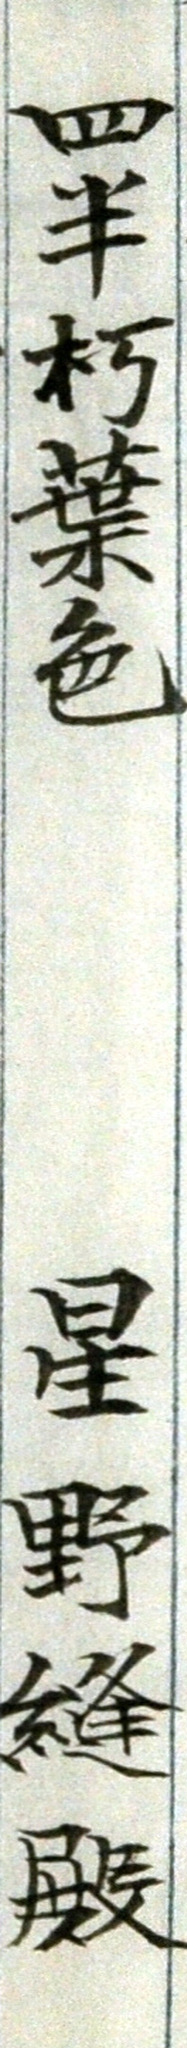一四半朽葉色星野縫殿
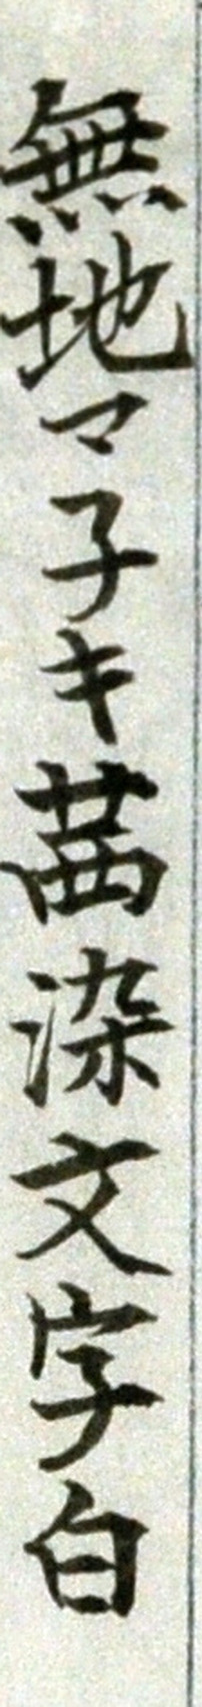無地マ子キ茜染文字白
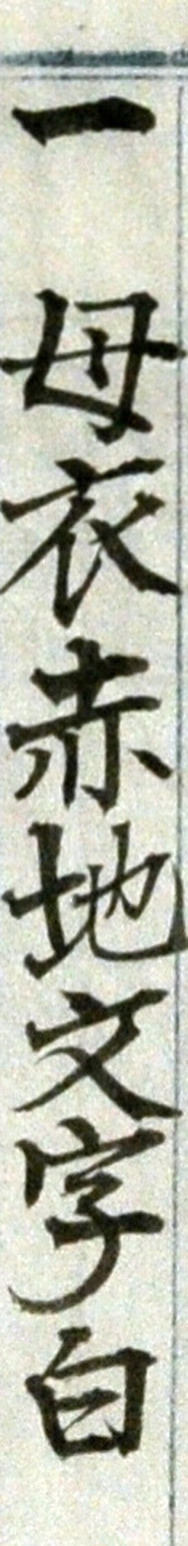一母衣赤字文字白
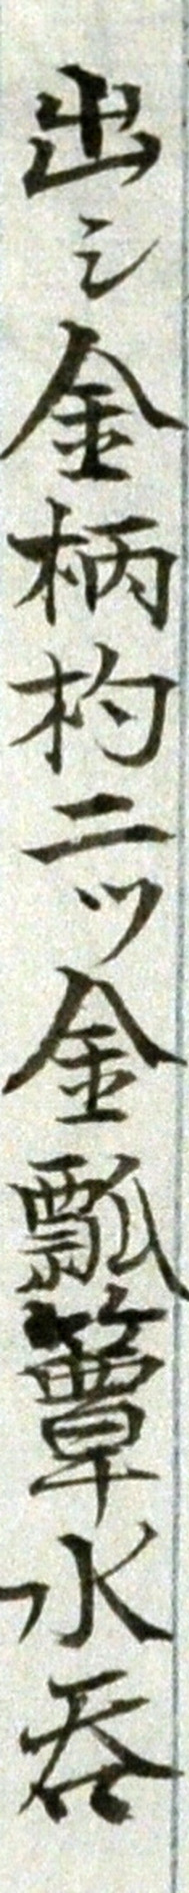出シ金柄杓二ツ金瓢箪水吞
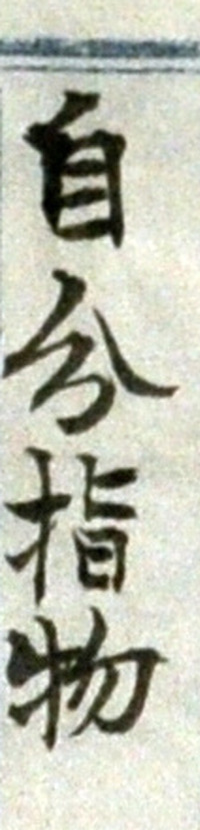自分指物
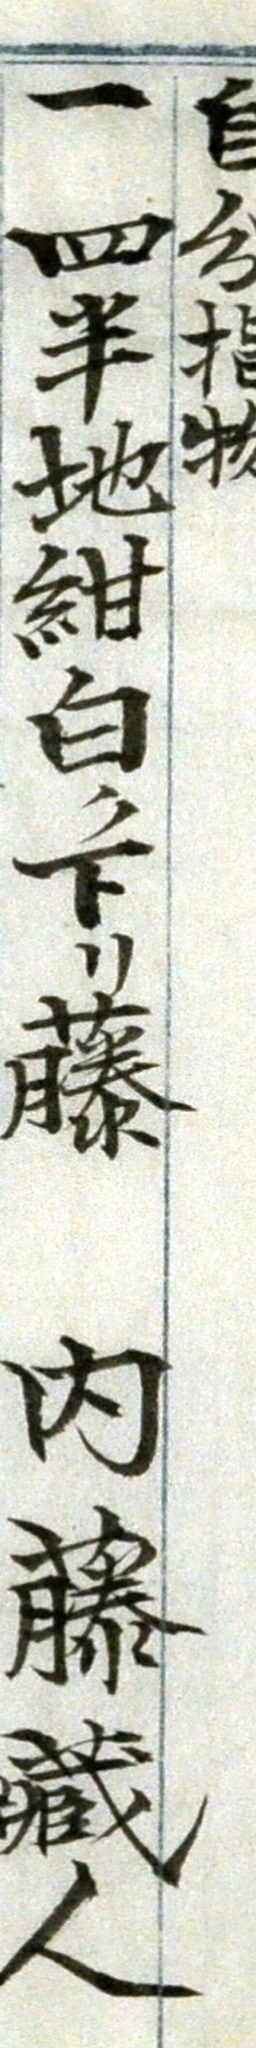一四半地紺白々下り藤内藤蔵人
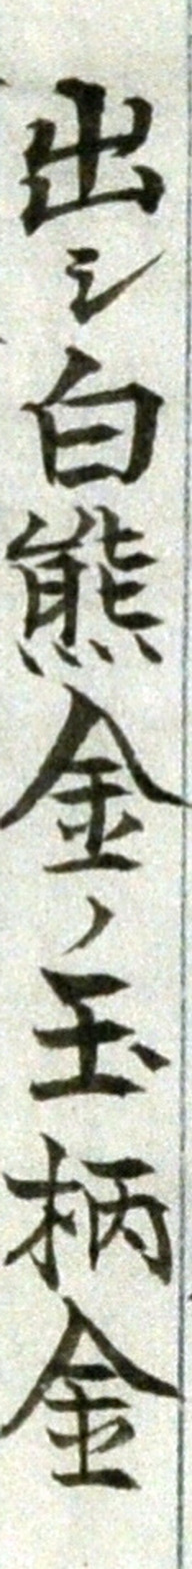出シ白熊金ノ玉柄金
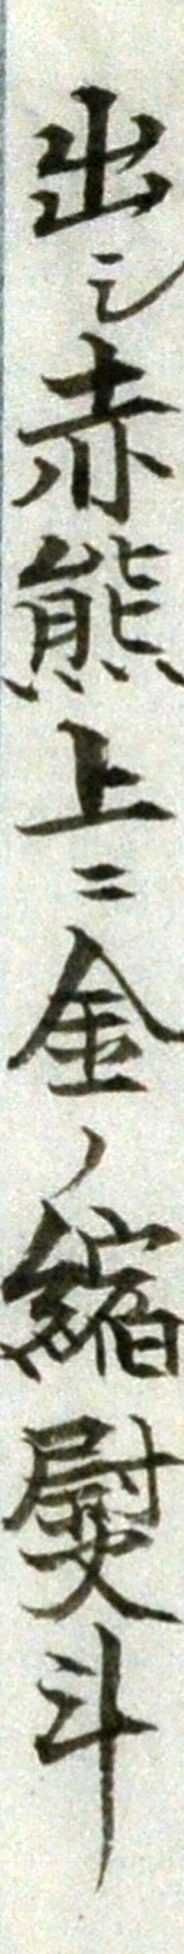出シ赤熊上ニ金ノ縮熨斗
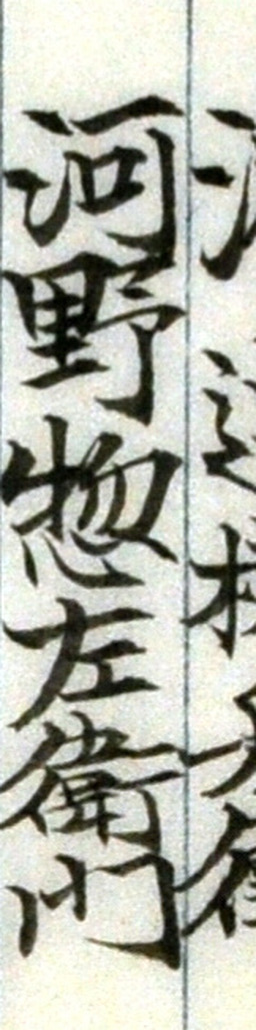河野惣左衛門
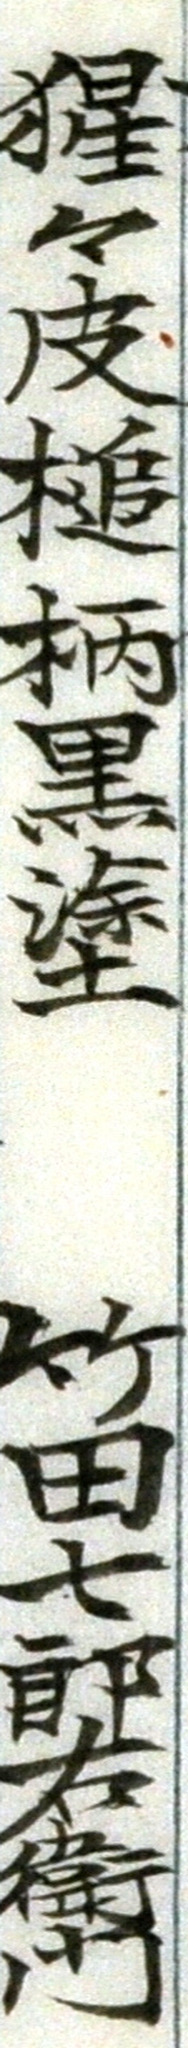一猩々皮槌柄黒塗竹田七郎右衛門
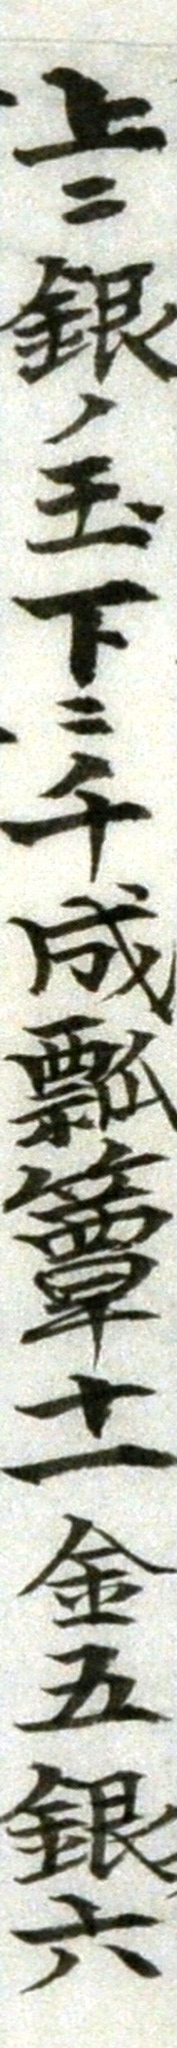上ニ銀ノ玉下ニ千成瓢箪十一金五銀六
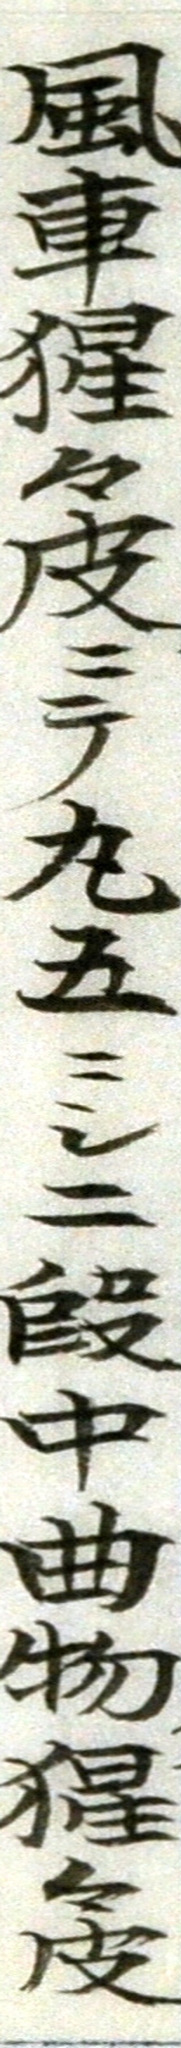風車猩々皮ニテ丸五ニシ二段中曲物猩々皮
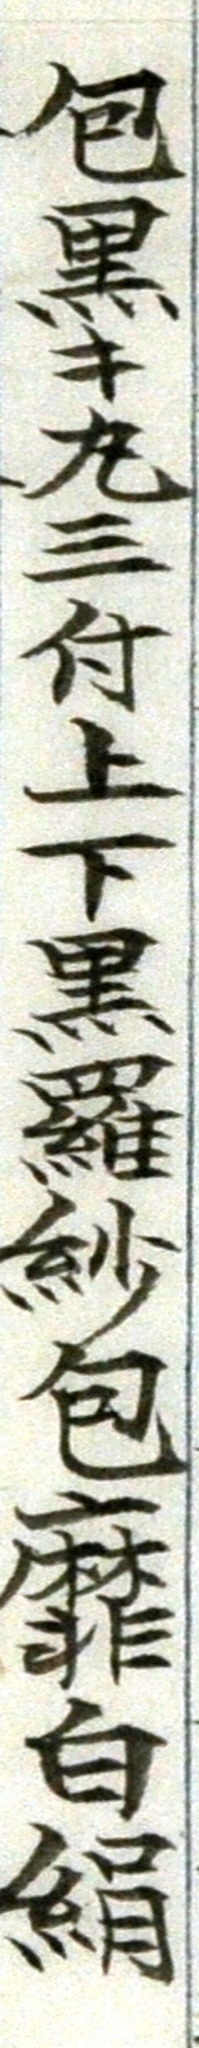包黒キ丸三付上下黒羅紗包白絹
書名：江戸高遠出シ品附之写
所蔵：伊那市立高遠町図書館・合同会社AMANE
